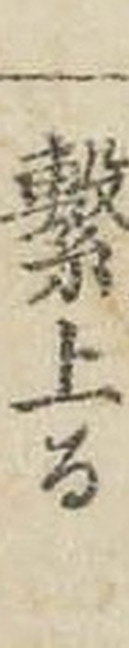繋上る
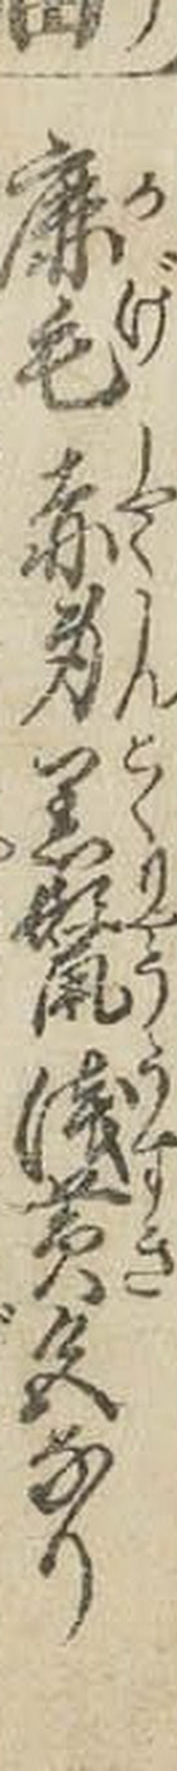騮鹿毛赤身黒鬣浅黄色なり
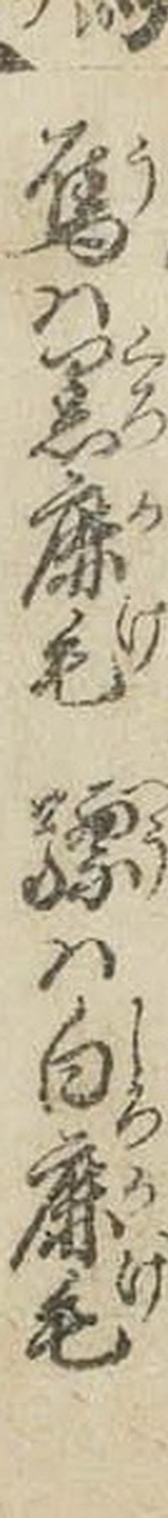烏は黒鹿毛驃は白鹿毛
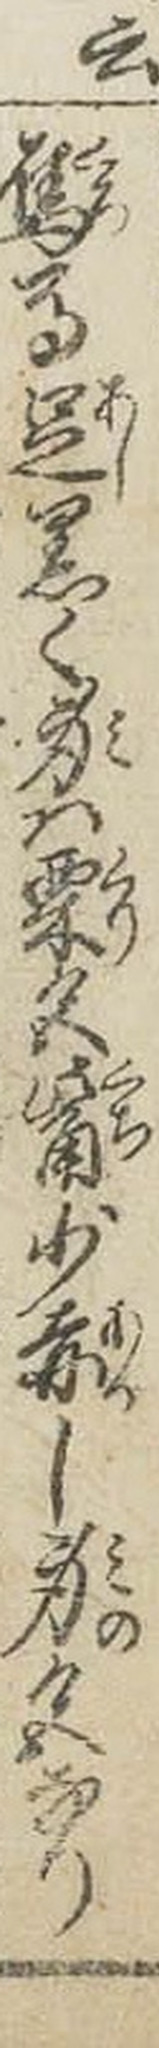烏馬足黒く身は栗色觜少赤し身色なり
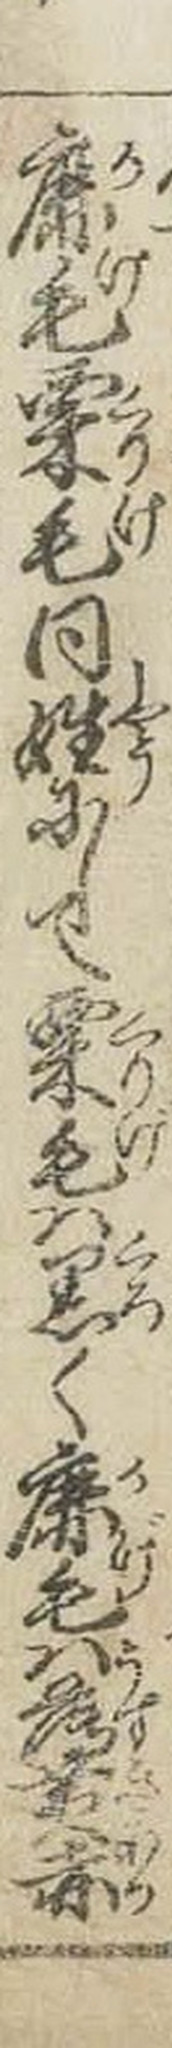鹿毛栗毛同姓にして栗毛は黒く鹿毛は薄黄赤
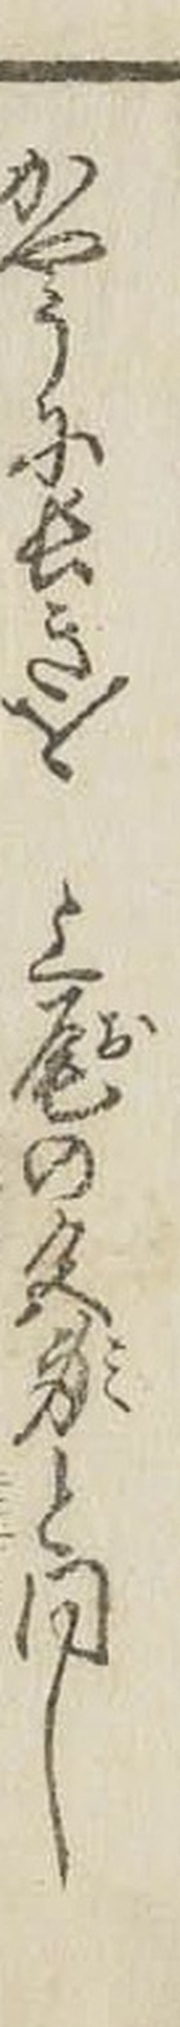かやうに長きを上尾の色身と同し
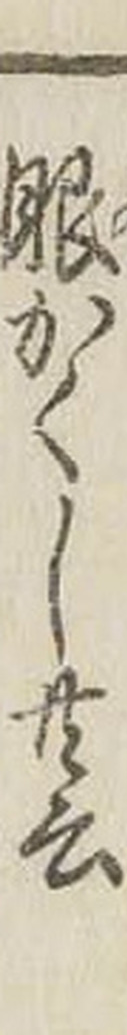眼かくし共云
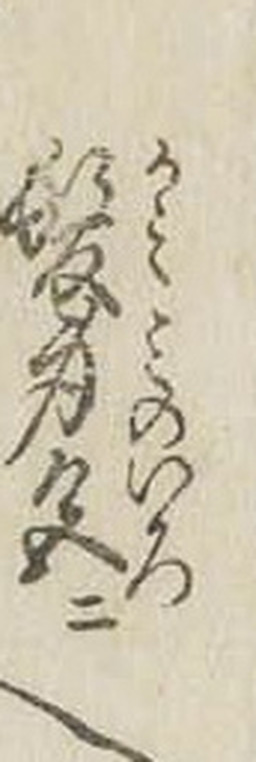髪身色に
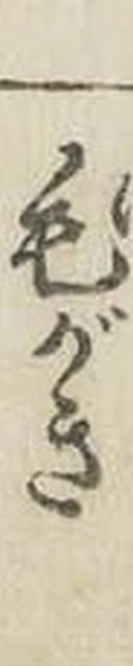毛がき
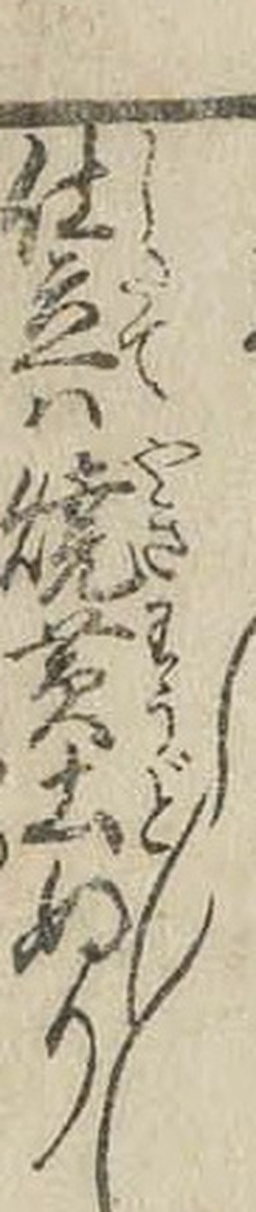仕立は焼黄土ぬり
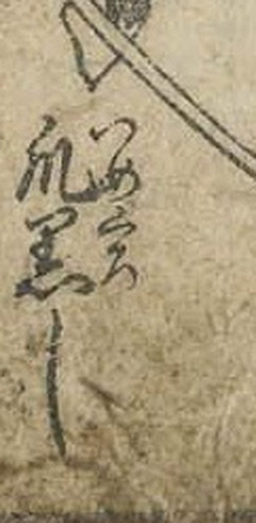爪黒し
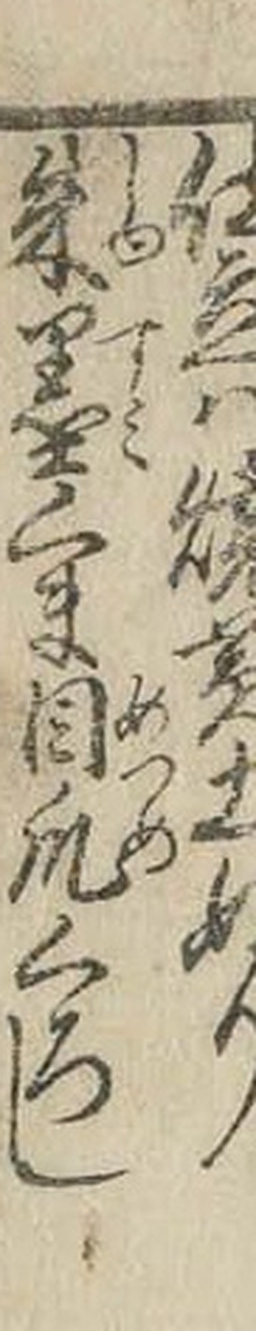朱墨くま目爪くろし
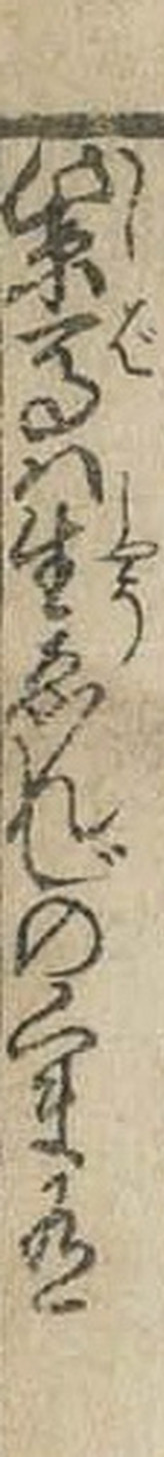柴馬は生ゑんじのくま有

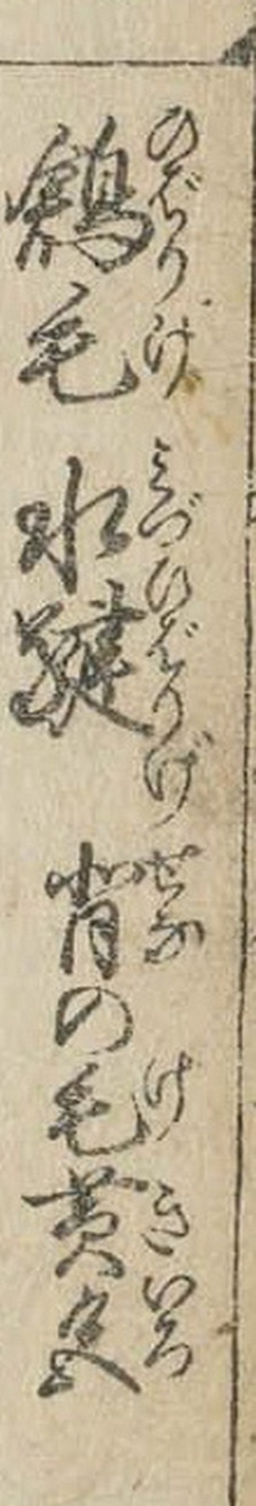騝鶬毛水騝背の毛黄色
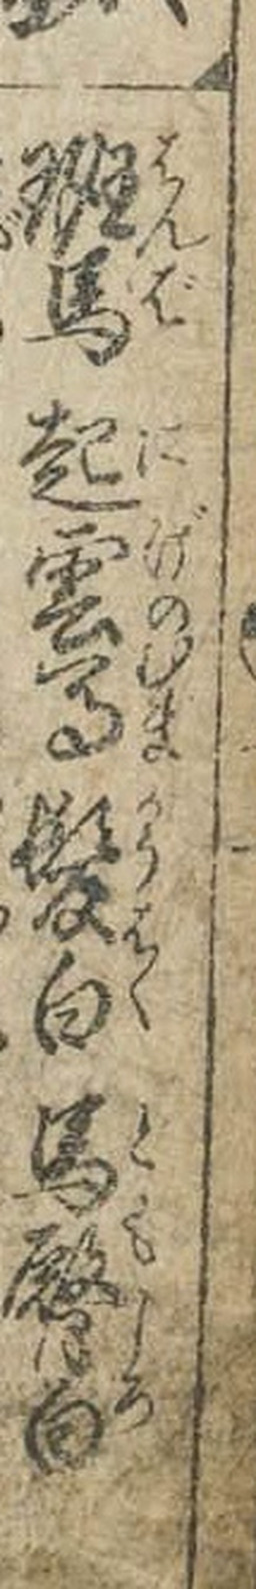駁斑馬起雲馬髪白馬臀白
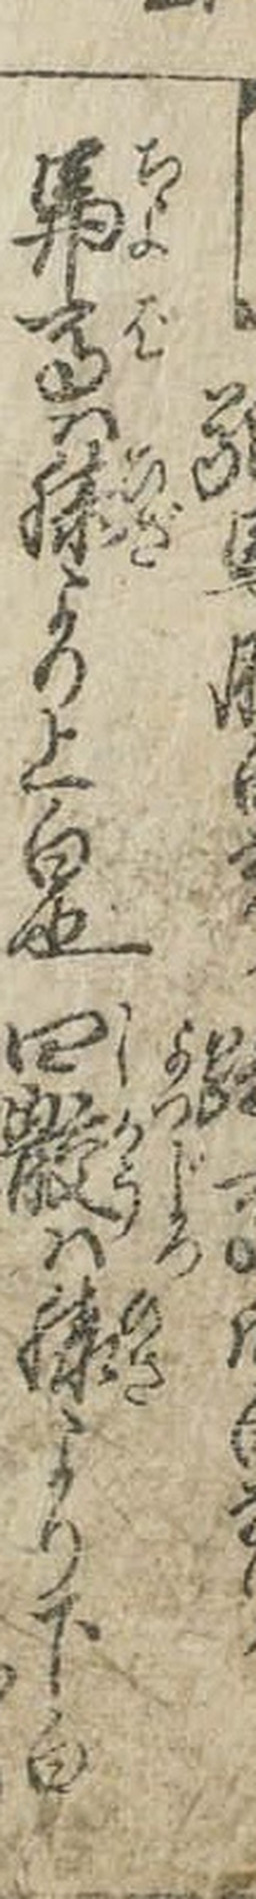馵馬は膝より上白也四骹は膝より下白なり
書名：絵本写宝袋 9巻 2之巻
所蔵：東京学芸大学教育コンテンツアーカイブ
